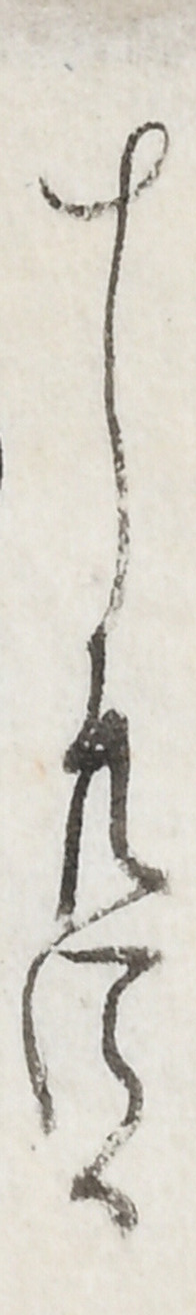十月廿四日
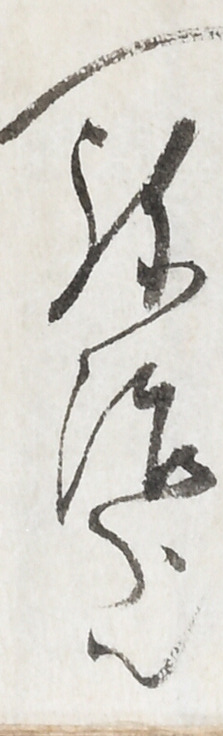弥治郎
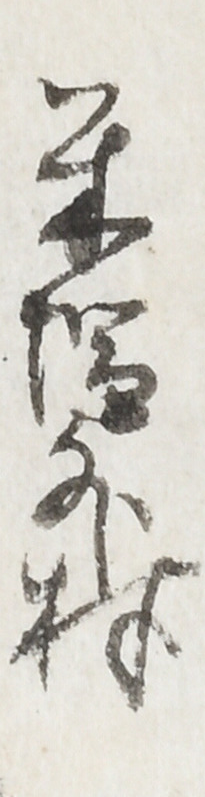米場外村
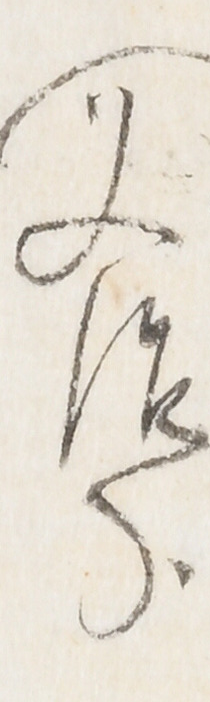文治郎
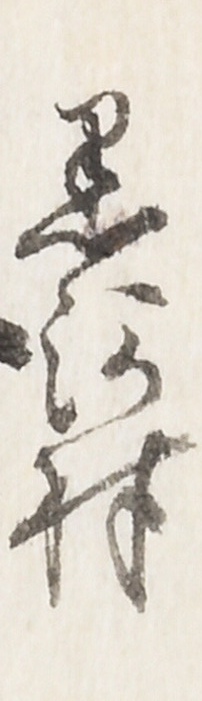黒河村
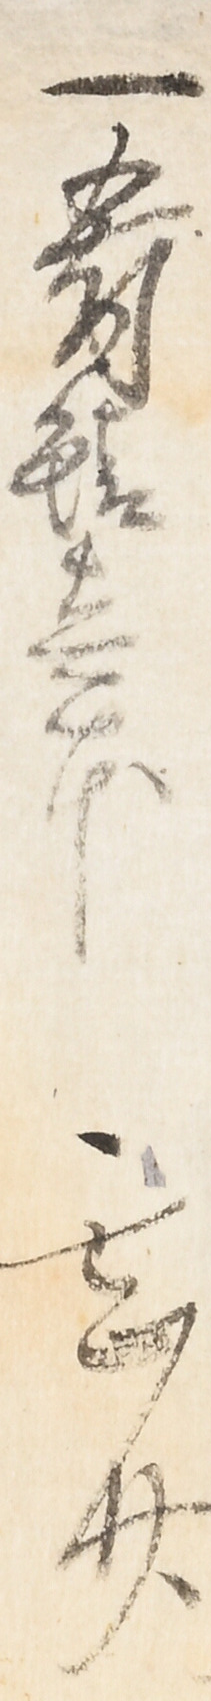一青鯖壱本甚介
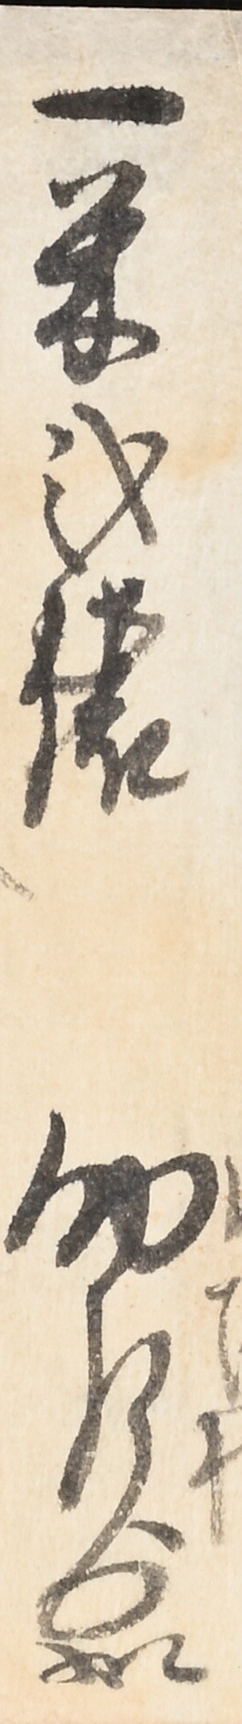一米弐俵助左衛門様
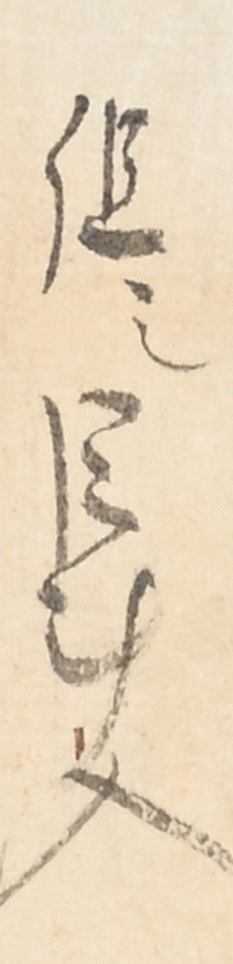但し四斗入
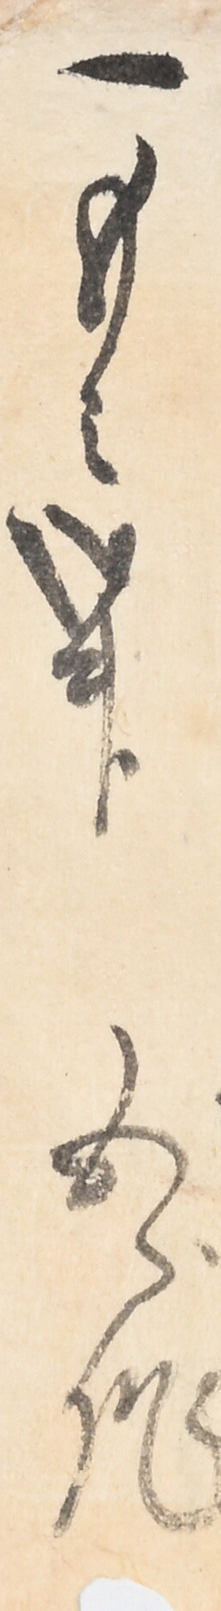一もみ弐升五郎作
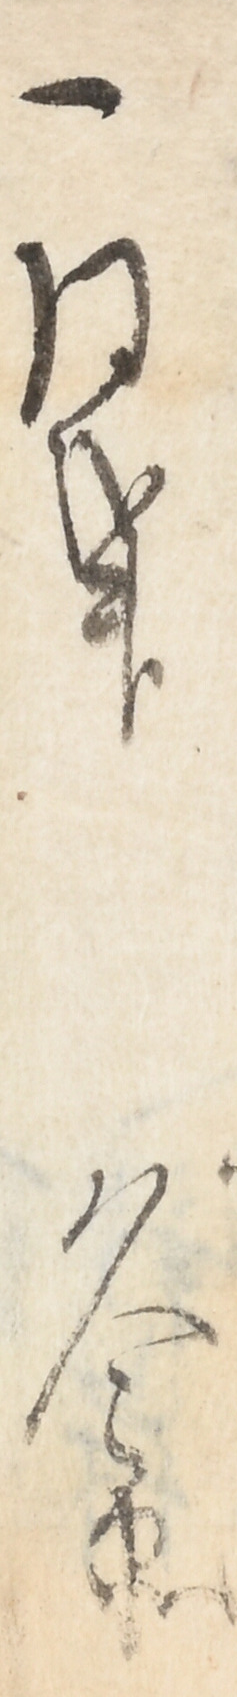一酒弐升武兵衛

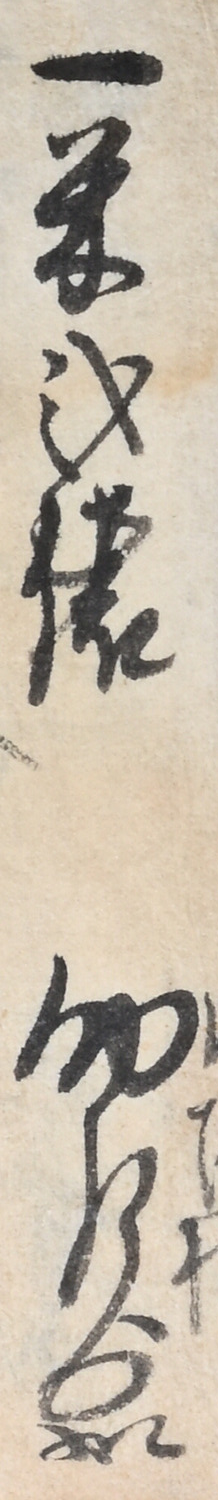一米弐升杢右衛門
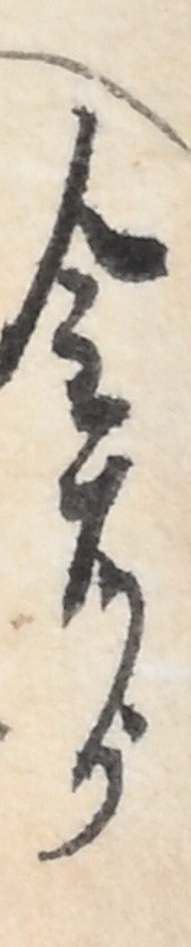金右衛門
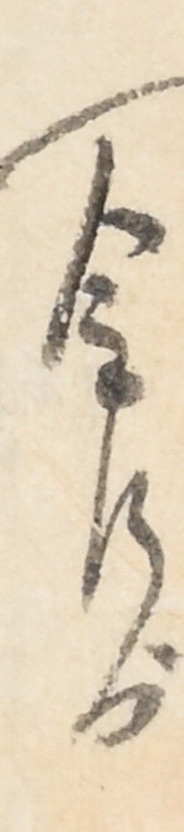金左衛門
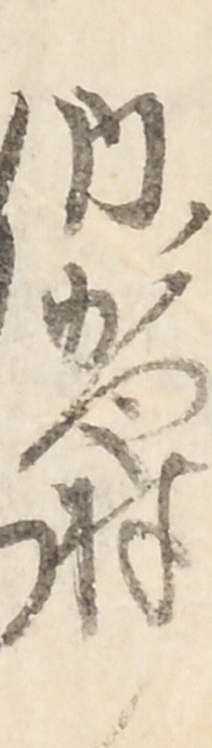内ノかや村
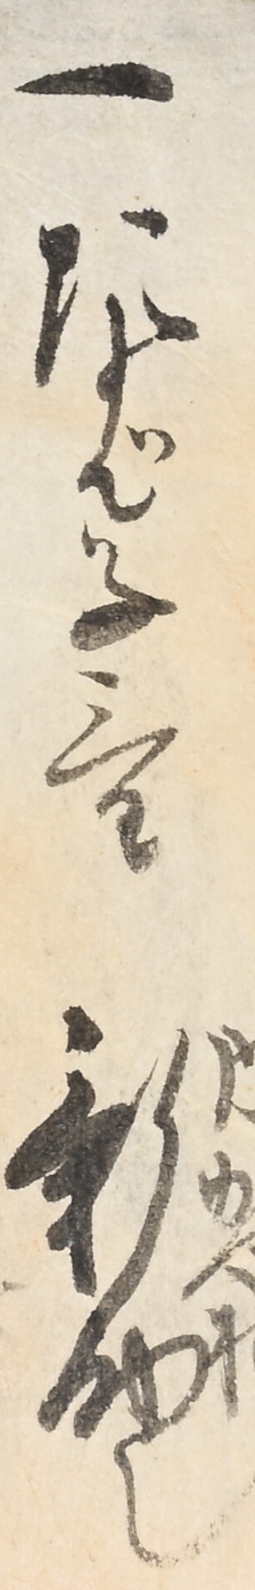一たばこ三わ新助し
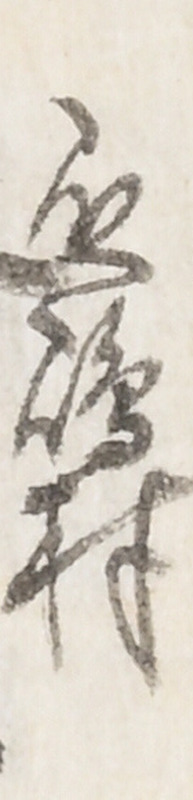殿嶋村
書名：合力覚帳
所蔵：伊那市立高遠町図書館・合同会社AMANE
